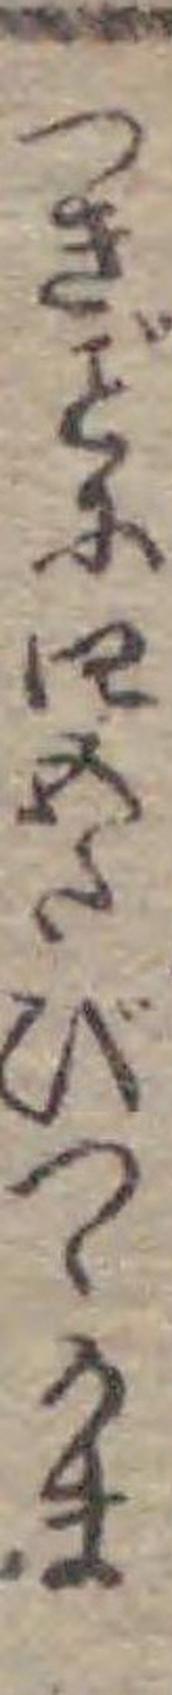つきごとに四五たびつゝかま
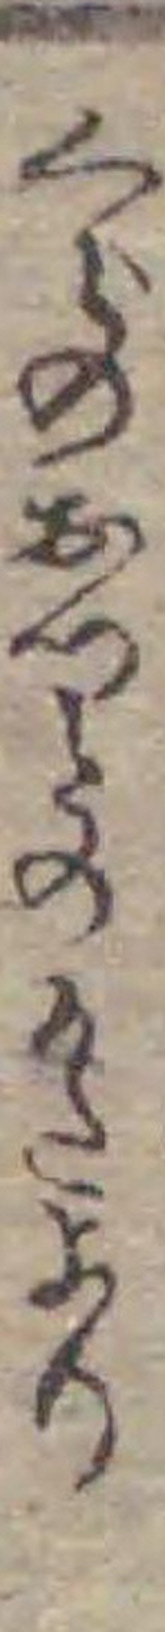くらのおつとのかたより
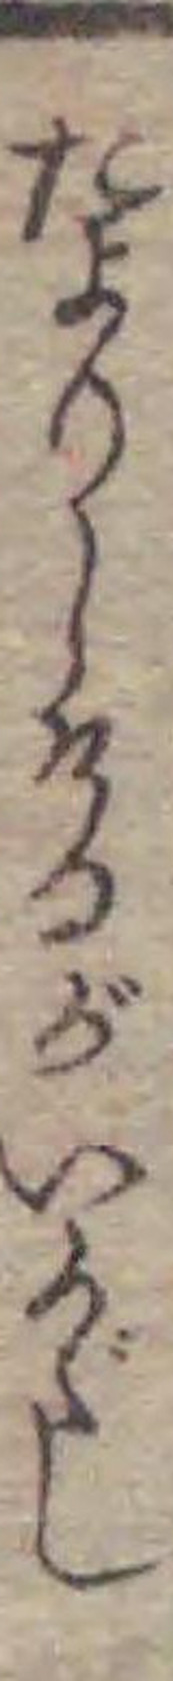たよりしけるがいかゞし
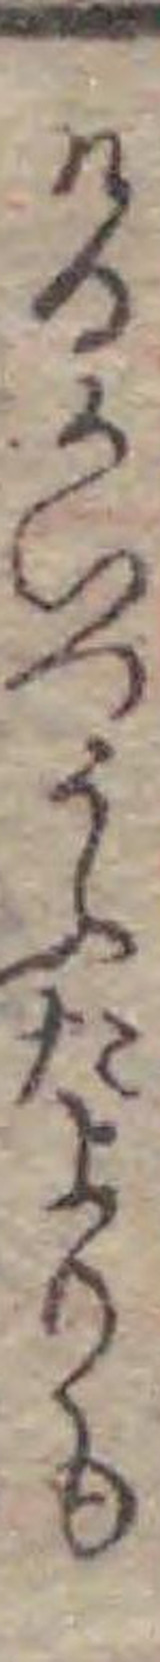けるかいつかふたよりも
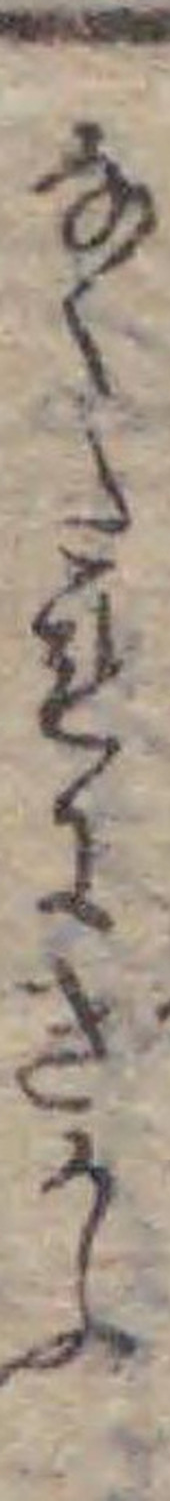なくたれにきかふ
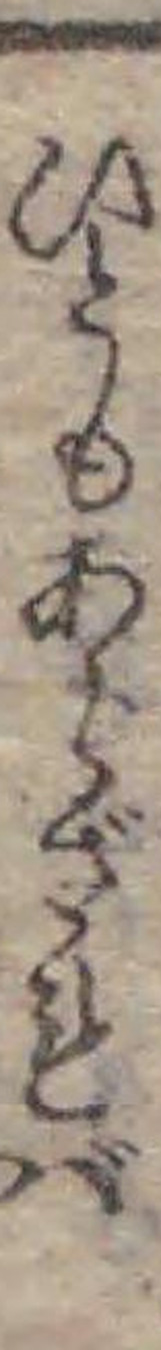ひともあらざれば
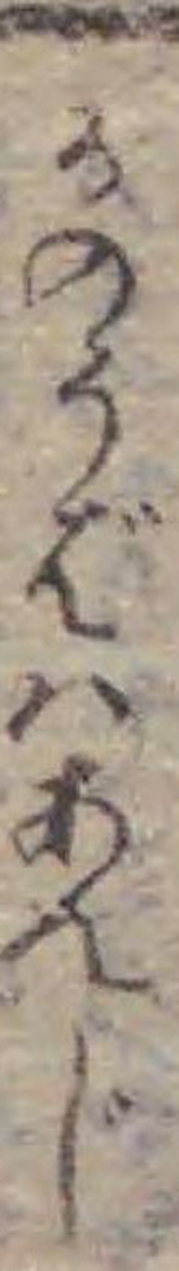かのうばはあんじ
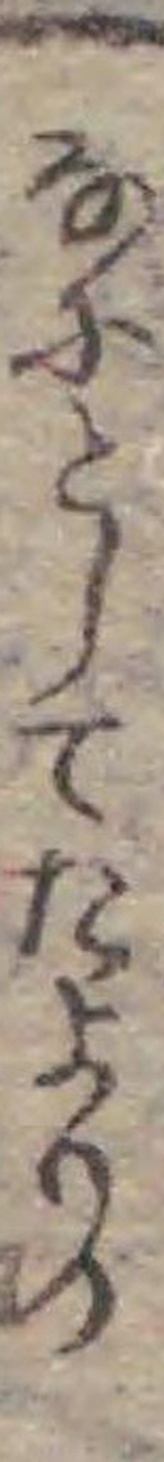なにとしてたよりか
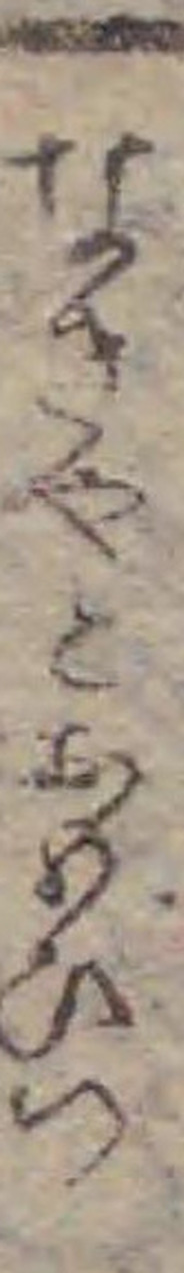なきやとおもひつ
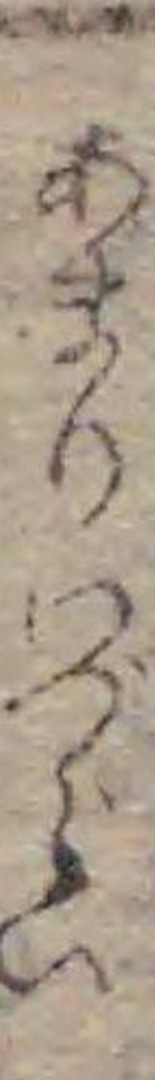あまりわづらい
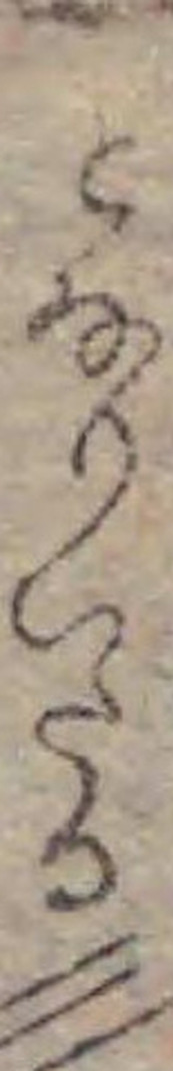となりいたる
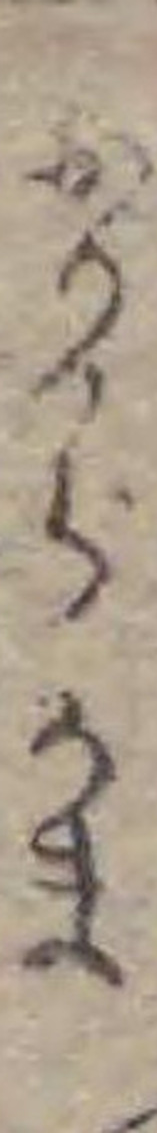おりからかま
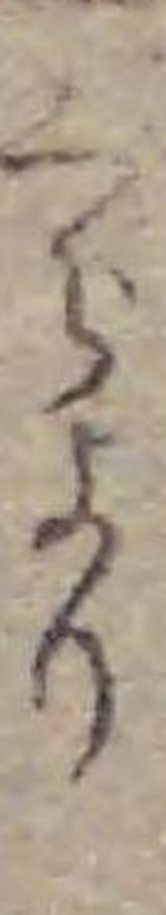くらより
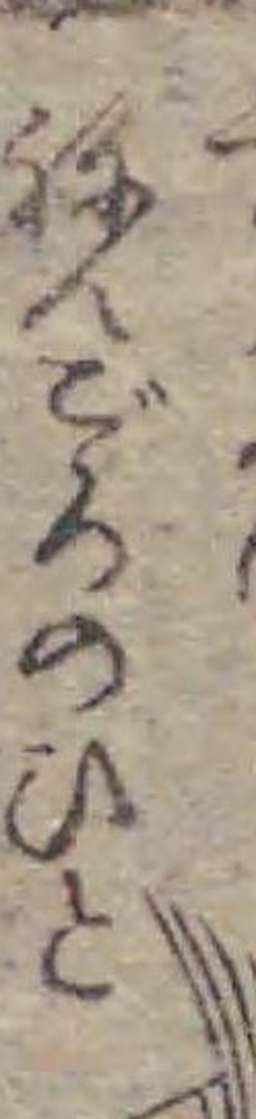ねんごろのひと
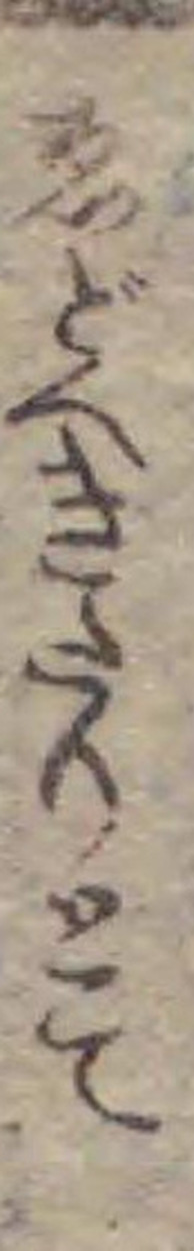ゑどへきたりとて
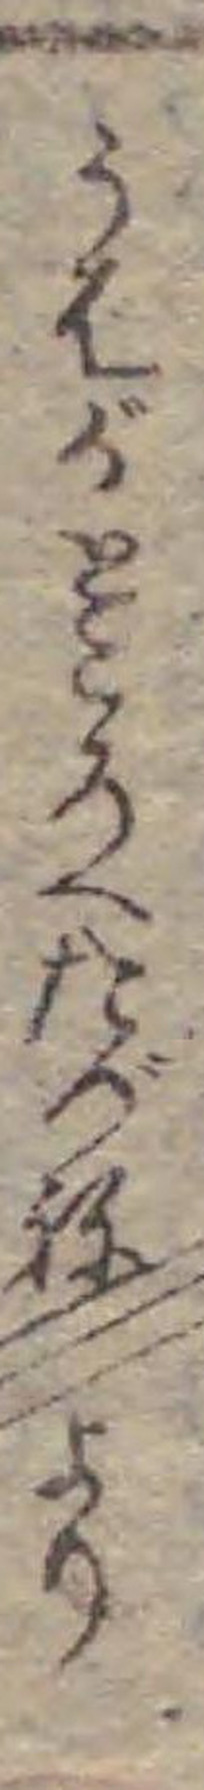うはがところへたづねより
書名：変化物春遊 : 2巻
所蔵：国立国会図書館 National Diet Library, JAPAN
